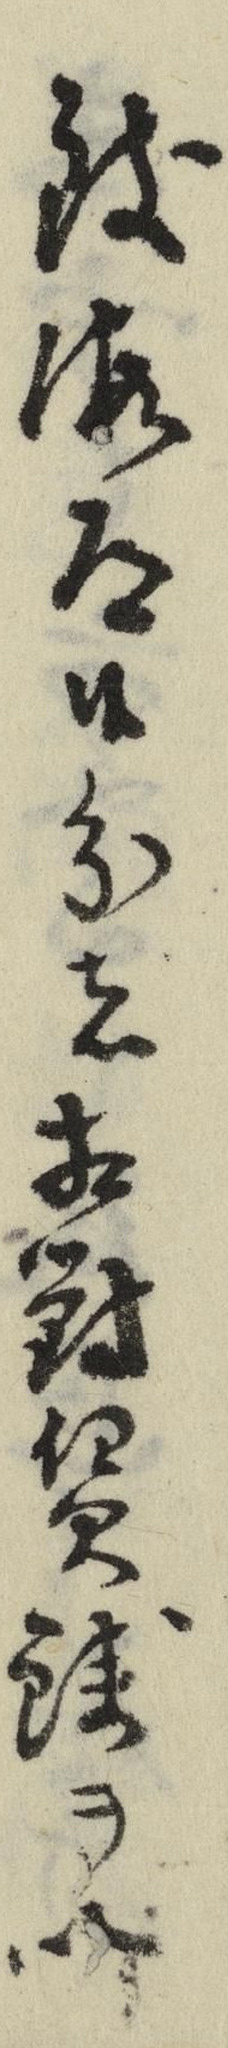致海道候分者相対賃銭ヲ以

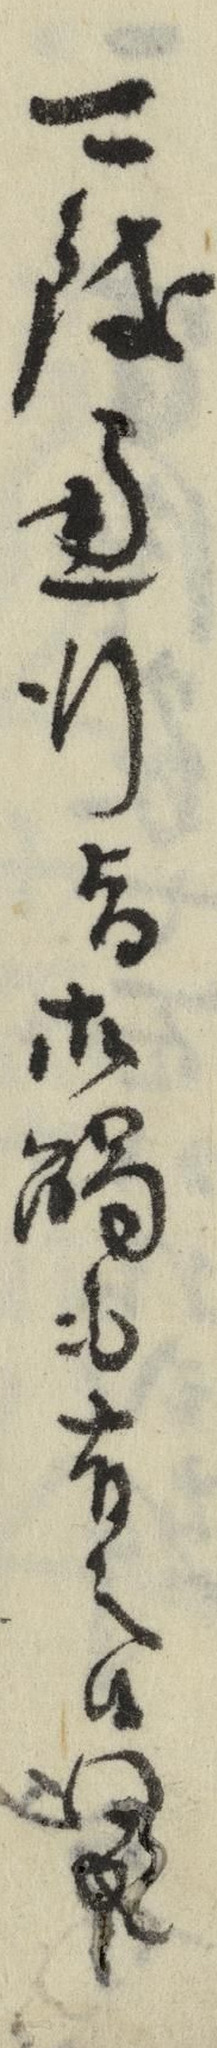可致通行旨御触も有之候得共
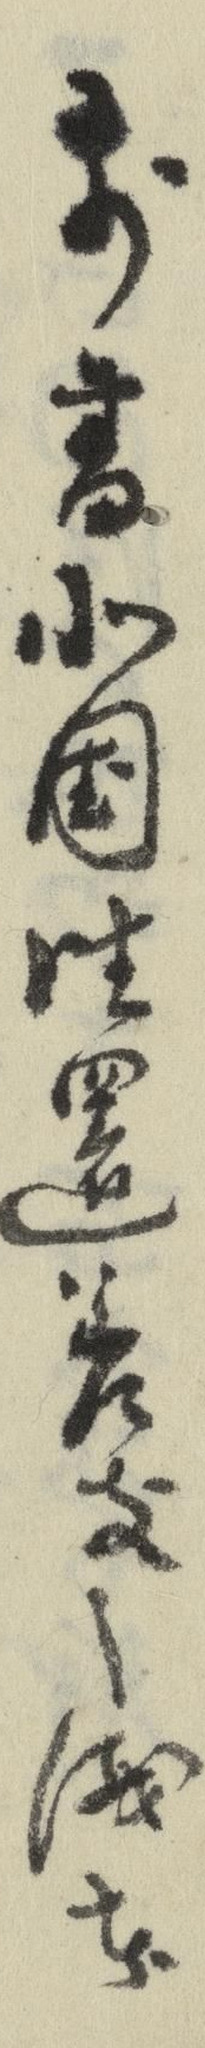前書北国往還差支之儀者
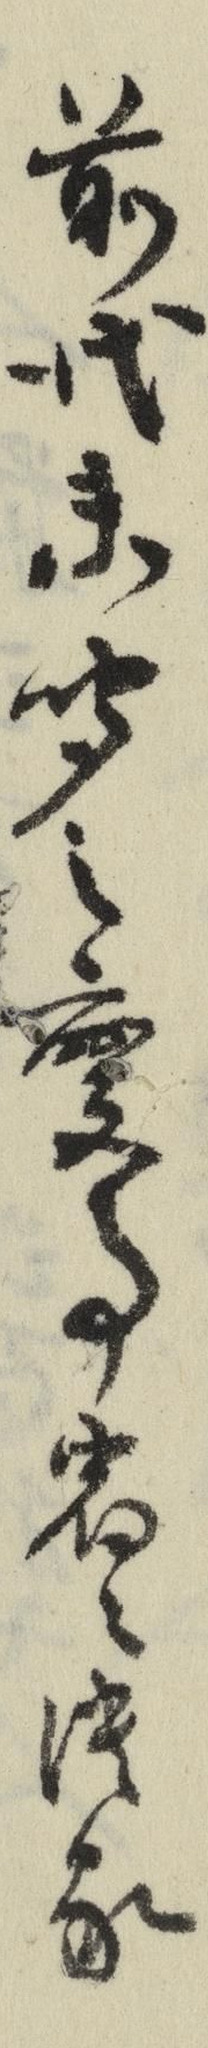前代未聞之変事宿々潰家
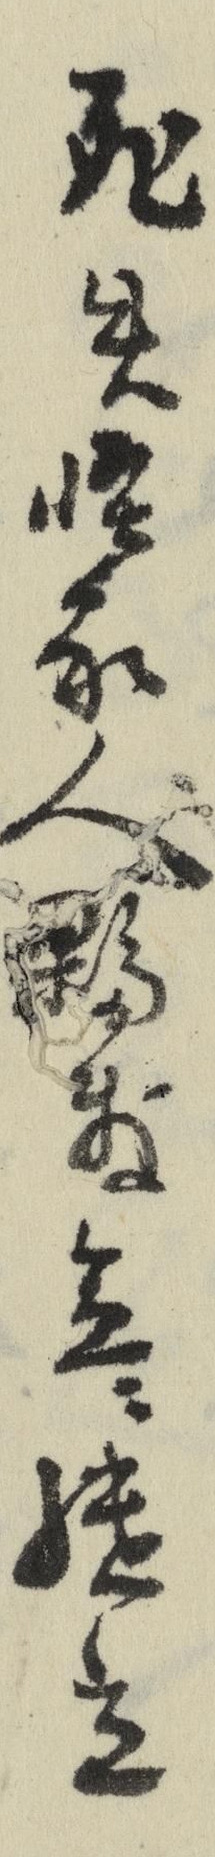死失怪我人夥敷並二継立
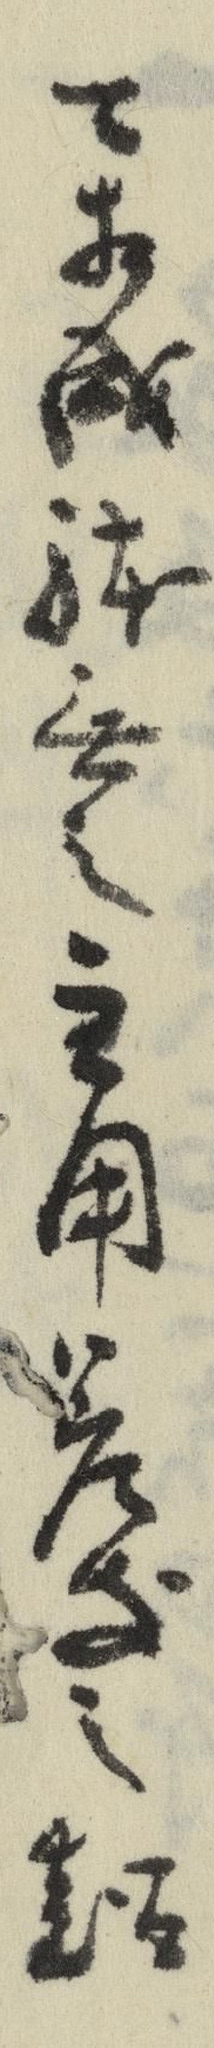可相成躰無之主用差支之趣
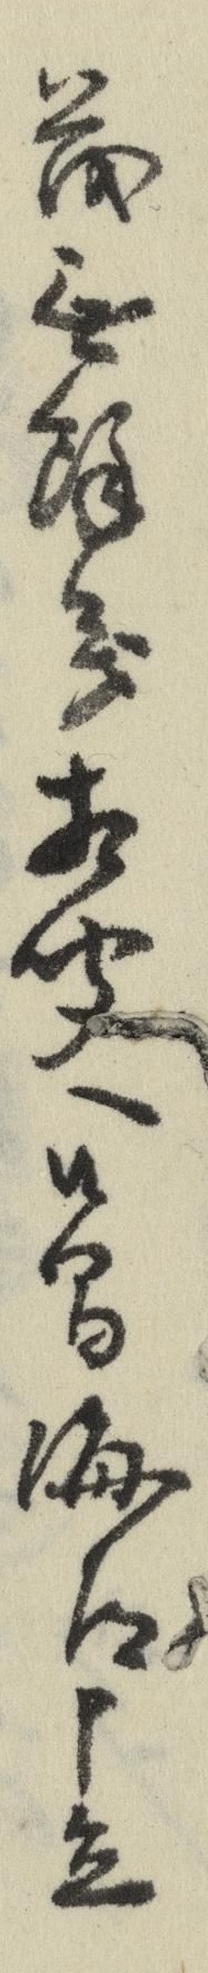も無余義相聞へ候間海道申立
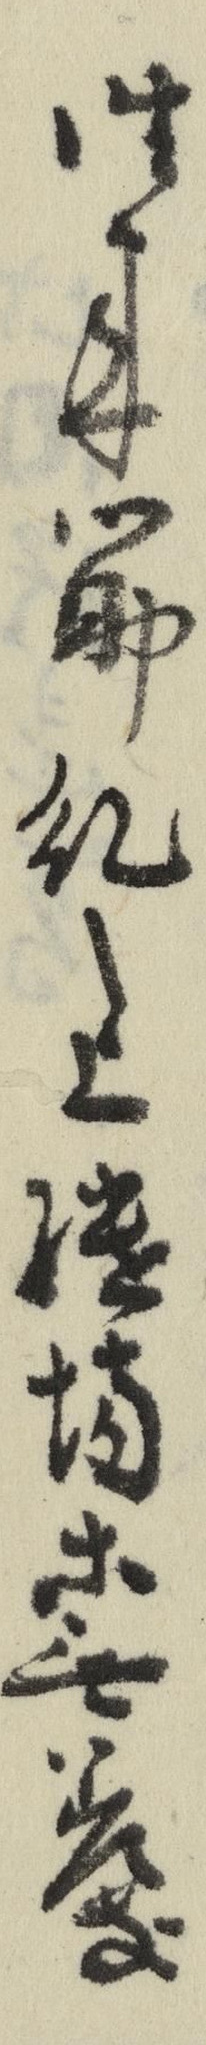往来筋糺之上継場等無差支
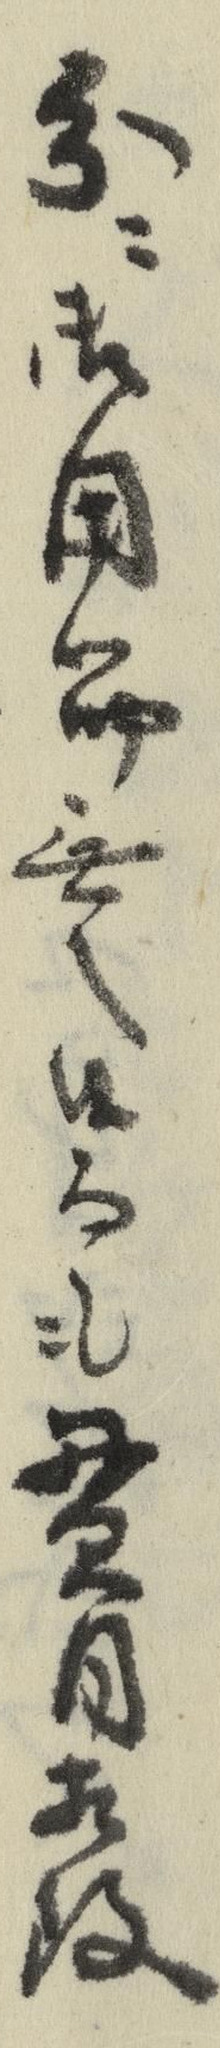分二御用筋無之候而も貫目相改
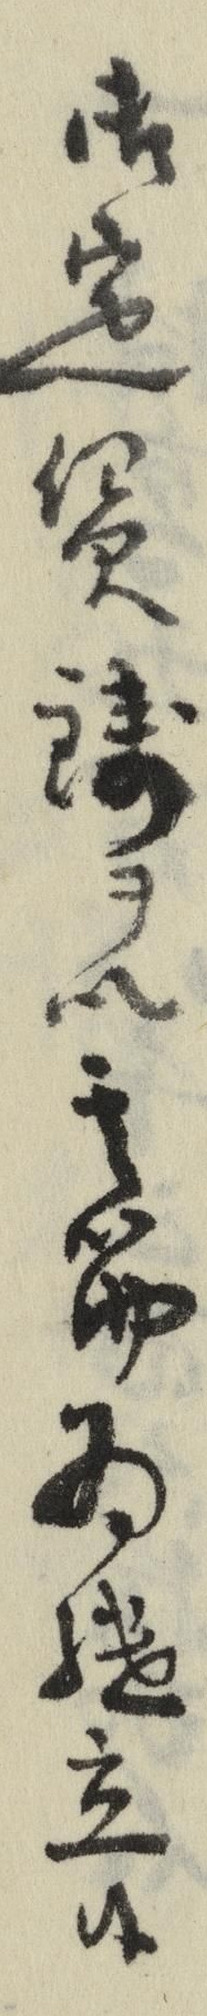御定賃銭ヲ以其筋為継立候
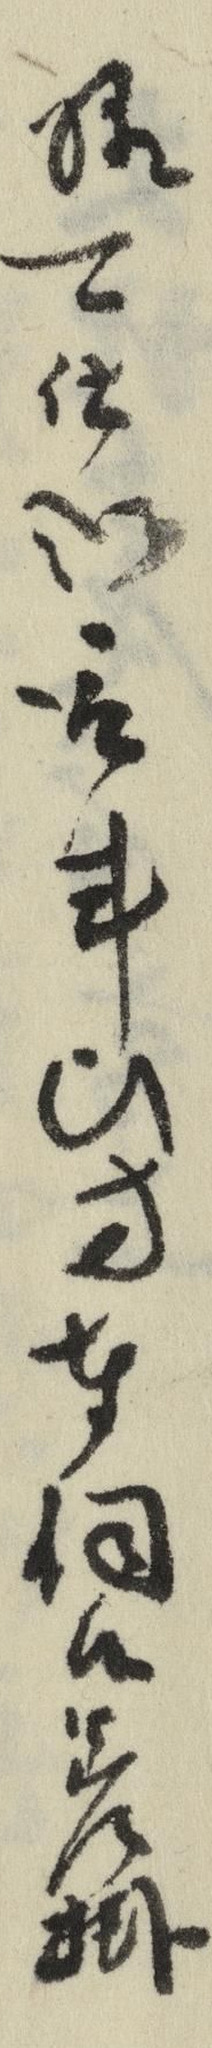様可仕哉取斗ひ方奉伺候差掛
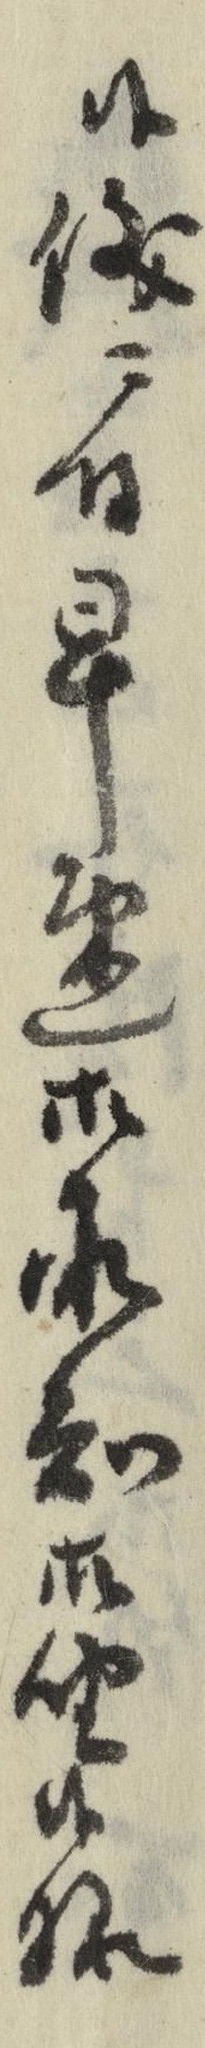候儀二付早速御承知御坐候様
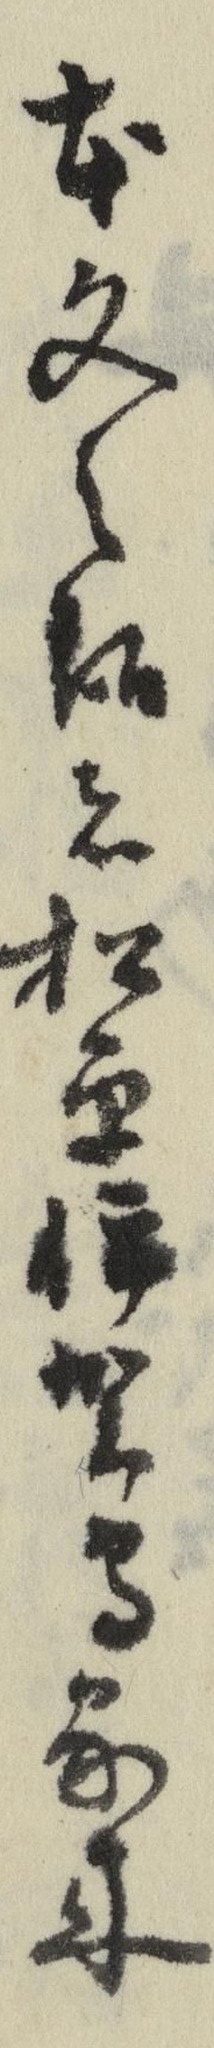本文之趣者松平伊賀趣家来
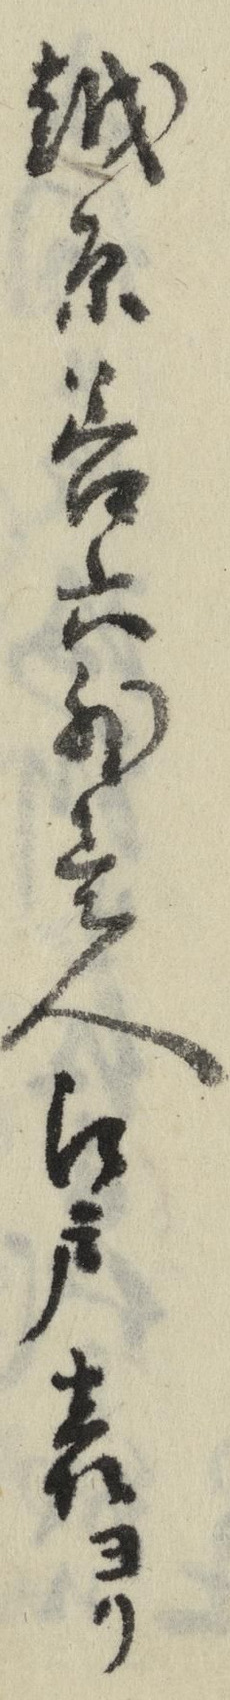越原善六外壱人江戸表ヨリ
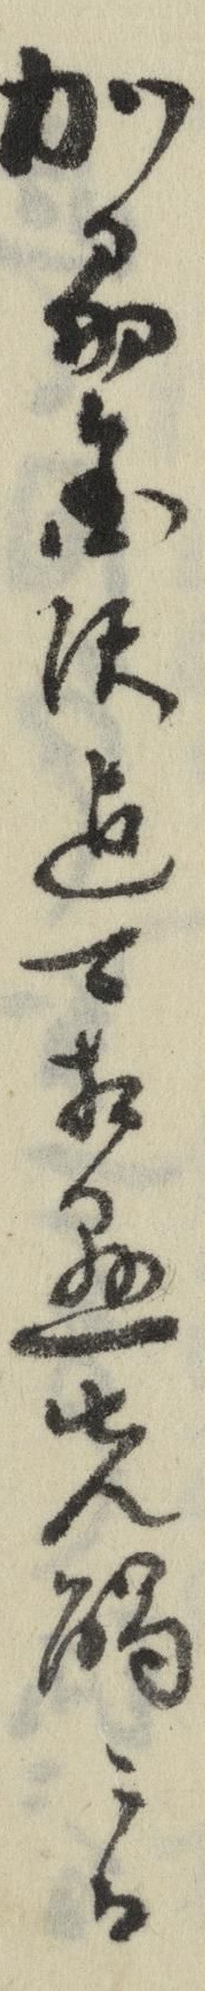加州金沢迄可相懸先触二而
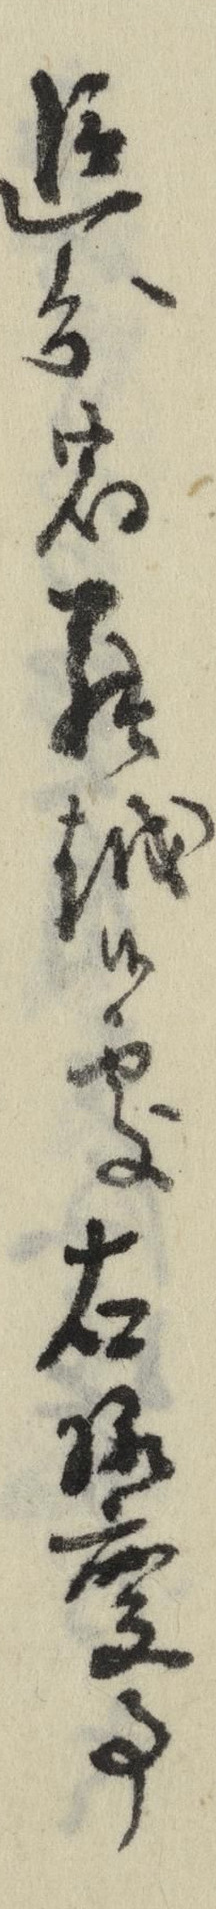追分宿罷越候処右様変事
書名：信州大地震一件之冩　丁未弘化四年三月吉日
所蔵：東京大学地震研究所図書室 Earthquake Research Institute Library, The University of Tokyo, JAPAN
